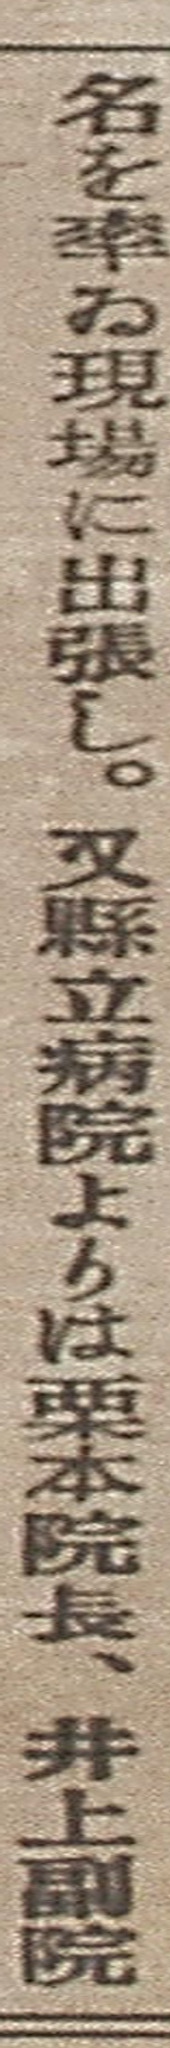名を率ゐ現場に出張し。又県立病院よりは栗本院長、井上副院
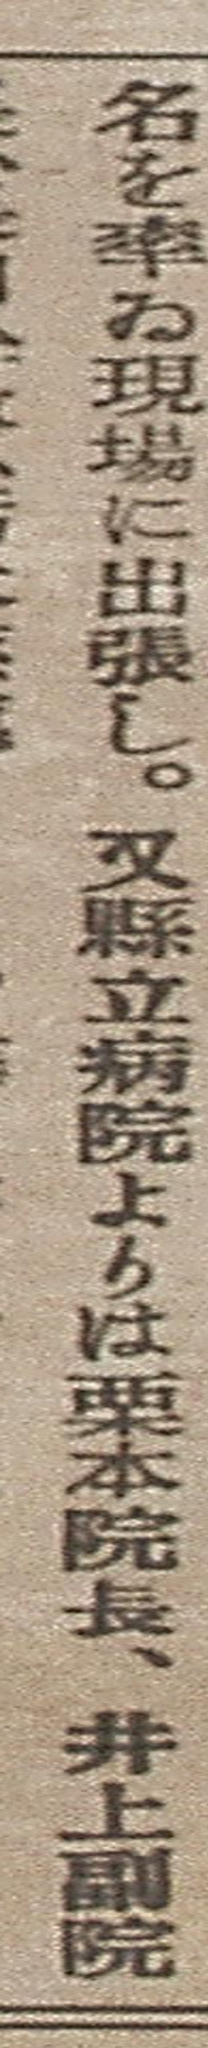名を率ゐ現場に出張し。又県立病院よりは栗本院長、井上副院
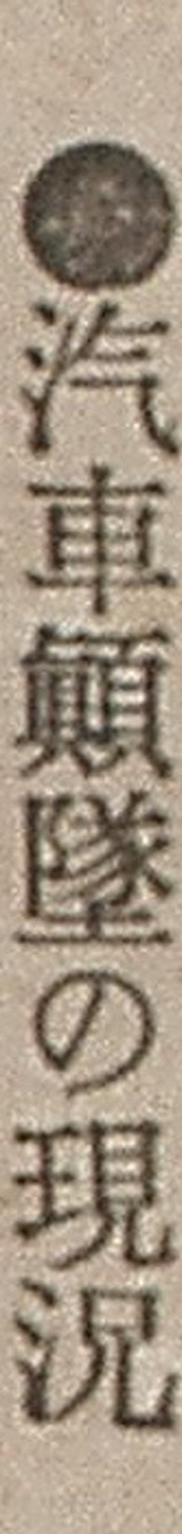●汽車顛墜の現況
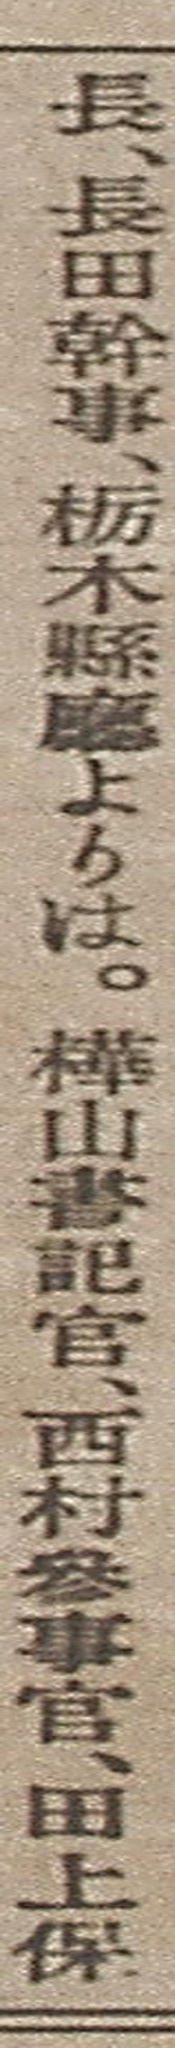長、長田幹事、栃木県庁よりは。樺山書記官、西村参事官、田上保
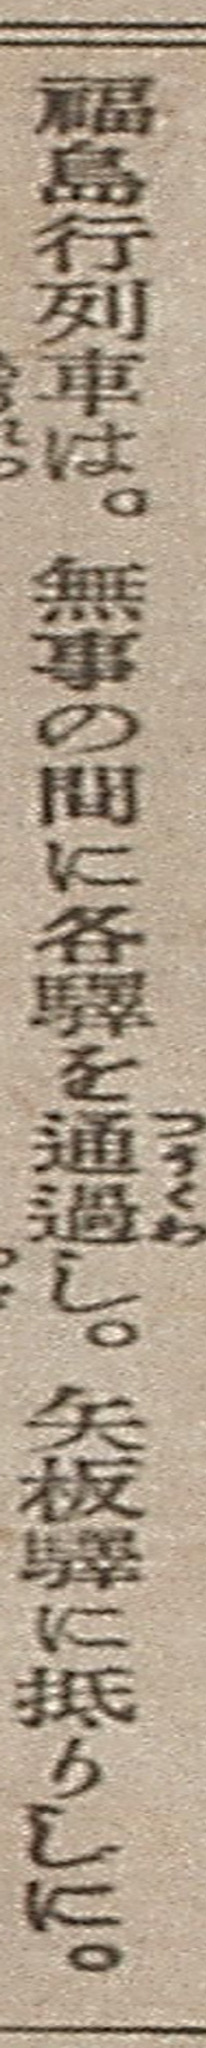福島行列車は。無事の間に各駅を通過し。矢板駅に抵りしに。
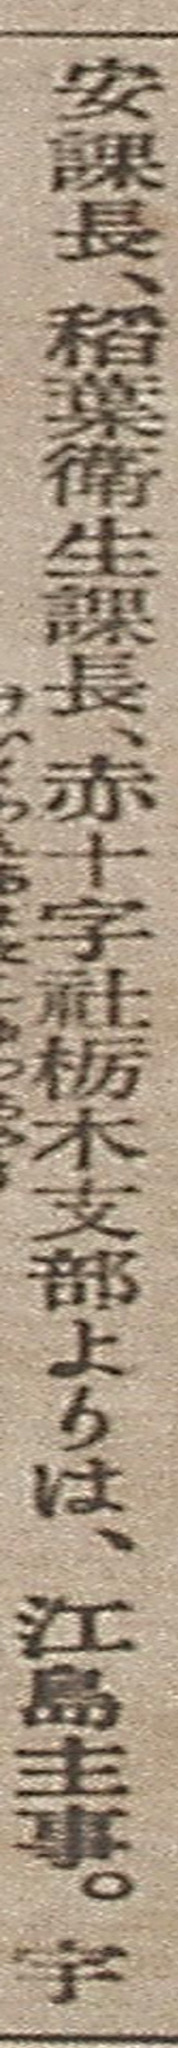安課長、稲葉衛生課長、赤十字社栃木支部よりは、江島主事。宇
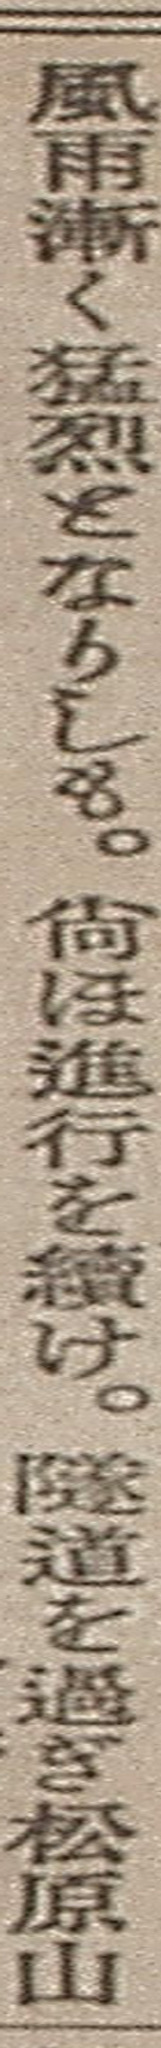風雨漸く猛烈となりしも。尚ほ進行を続け。隧道を過ぎ松原山
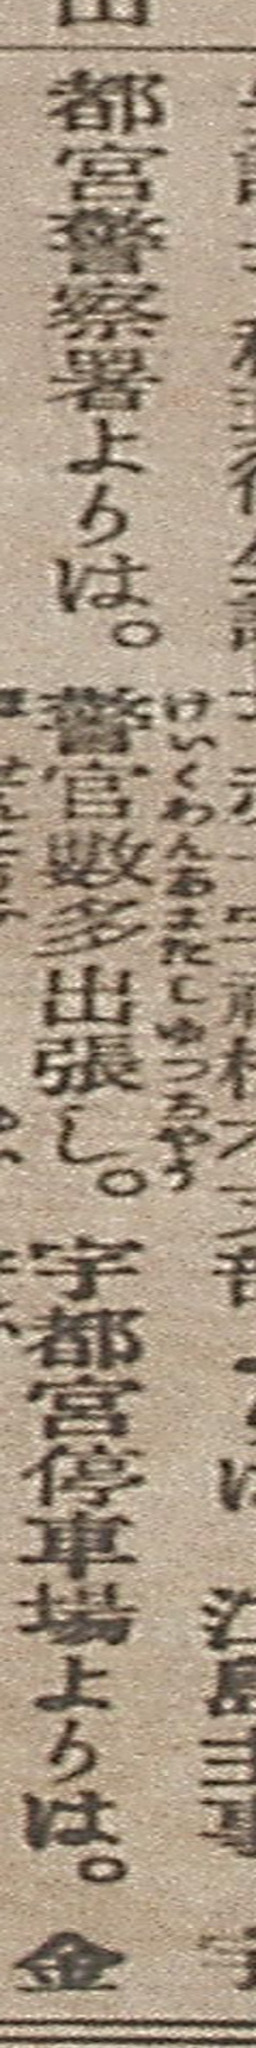都宮警察署よりは。警官数多出張し。宇都宮停車場よりは。金
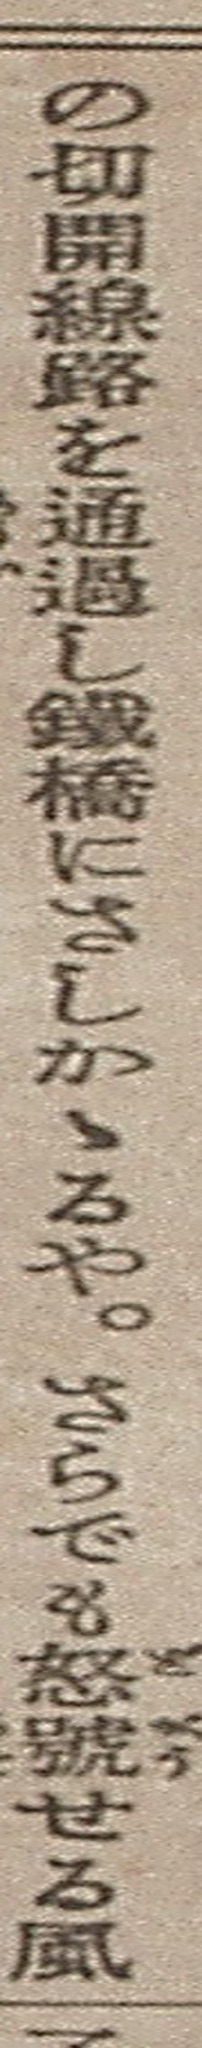の切開線路を通過し鉄橋にさしかゝるや。さらでも怒号せる風
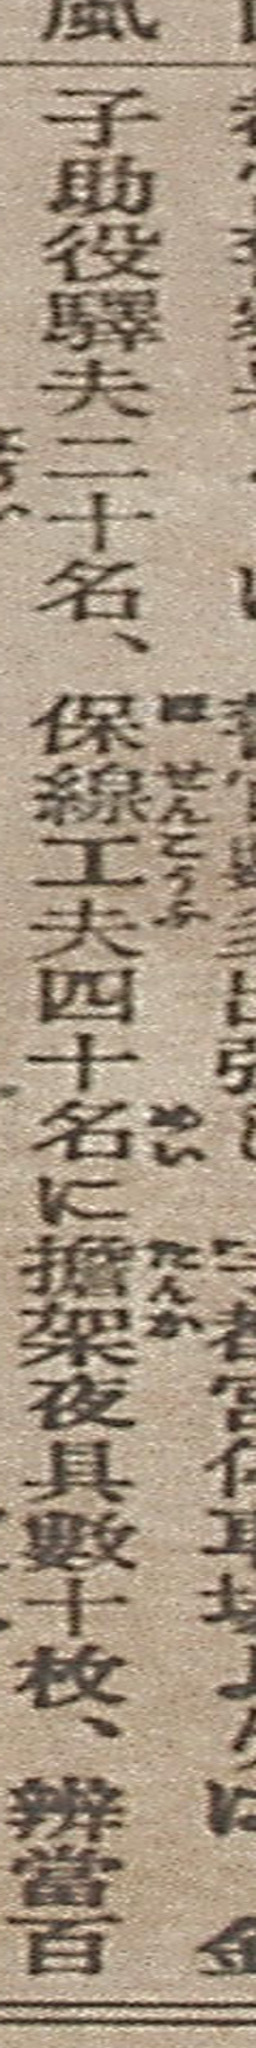子助役駅夫二十名、保線工夫四十名に担架夜具数十枚、弁当百
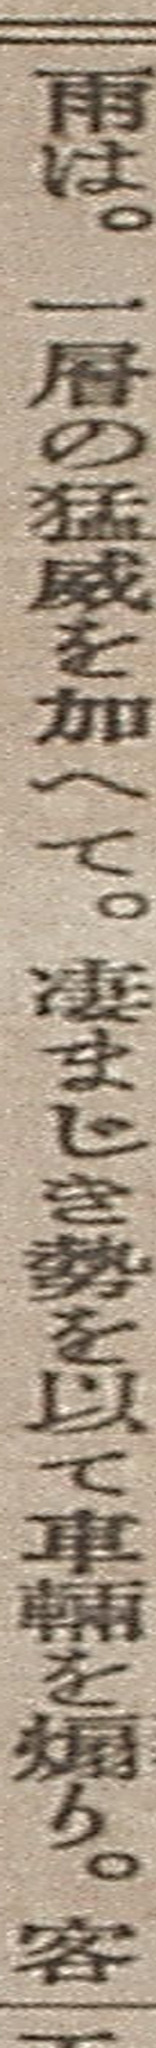雨は。一層の猛威を加へて凄まじき勢を以て車両を煽り。客
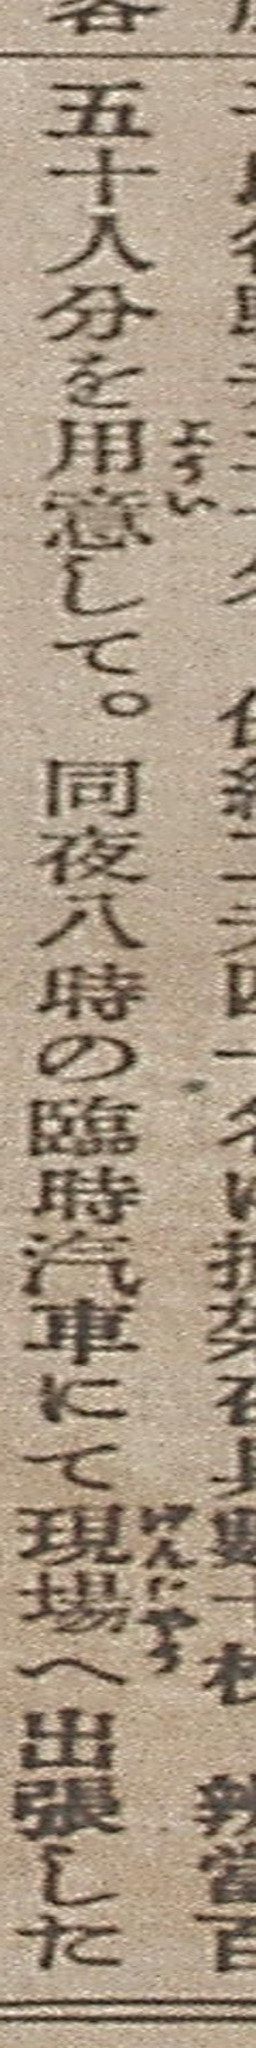五十人分を用意して。同夜八時の臨時汽車にて現場へ出張した
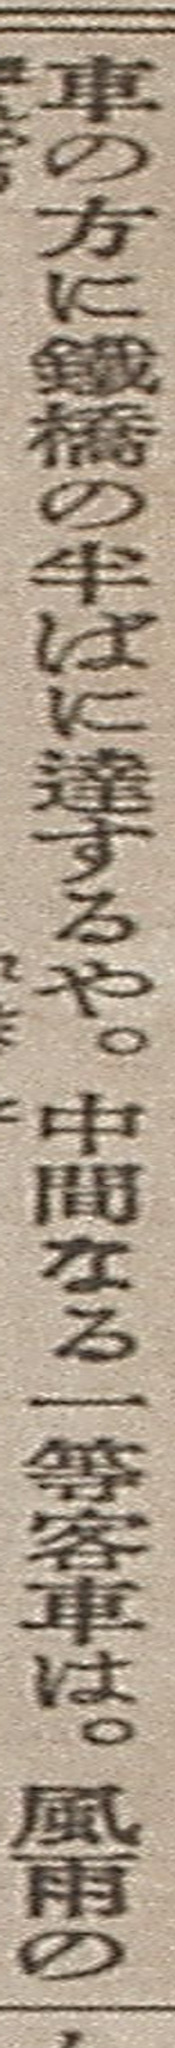車の方に鉄橋の半ばに達するや。中間なる一等客車は。風雨の
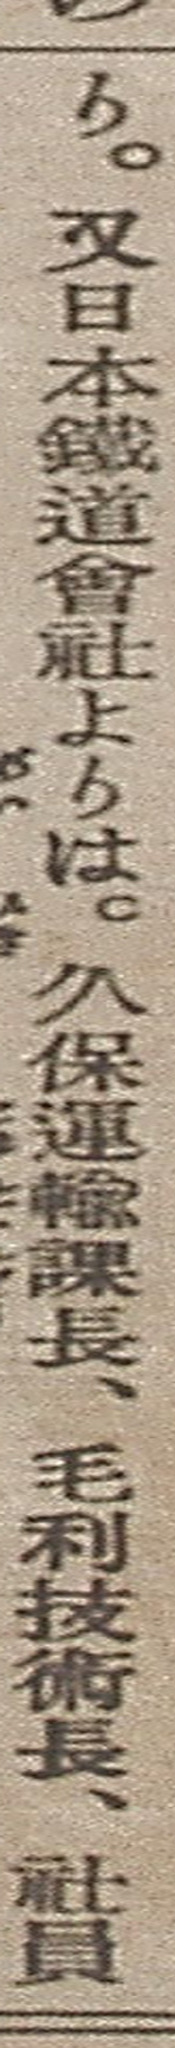り。又日本鉄道会社よりは。久保運輸課長、毛利技術長、社員
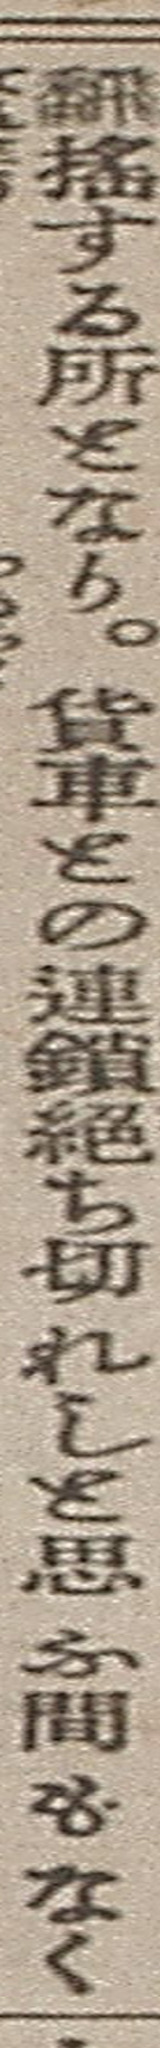飜揺する所となり。貨車との連鎖断ち切れしと思ふ間もなく
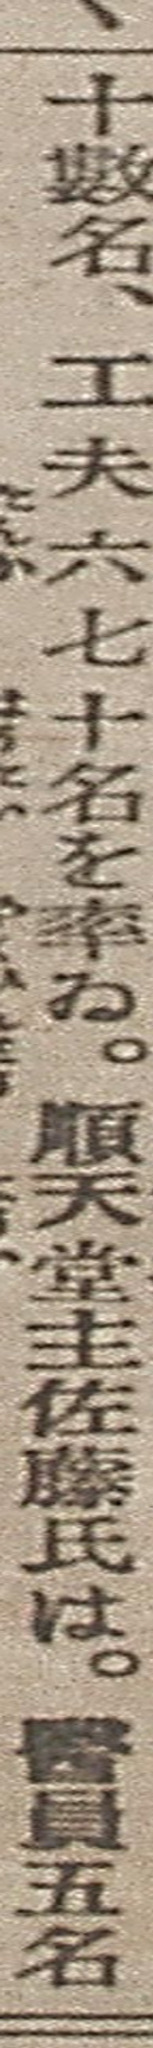十数名、工夫六七十名を率ゐ。順天堂主佐藤氏は。医員五名
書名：風俗畫報臨時増刊第百九十九號　明治三十二年十月各地災害圖會（前編之續）
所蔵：東京大学地震研究所図書室 Earthquake Research Institute Library, The University of Tokyo, JAPAN
